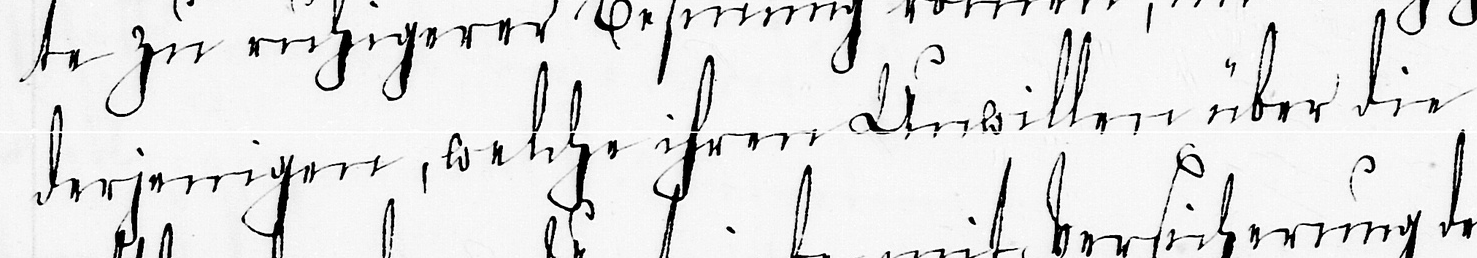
derjenigen, welche ihren Unwillen über die
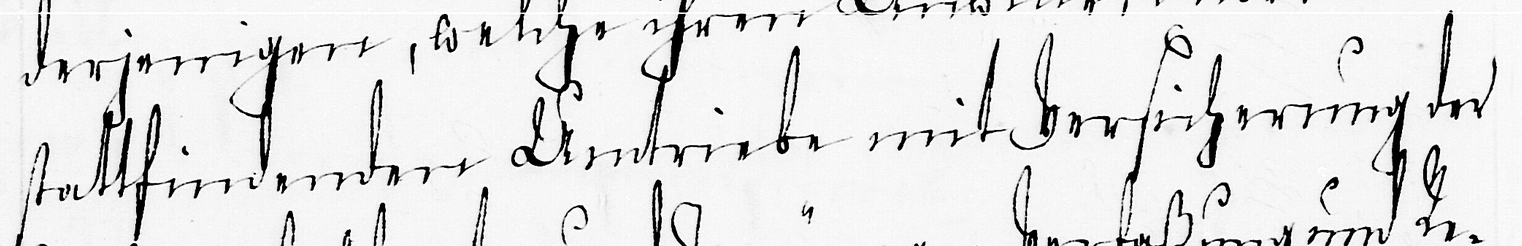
stattfindenden Umtriebe mit Versicherung der
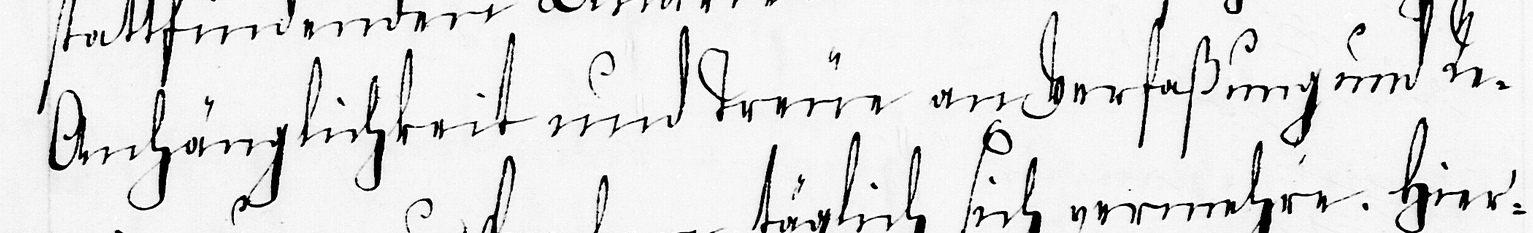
Anhänglichkeit und Treue an Verfaßung und Re¬
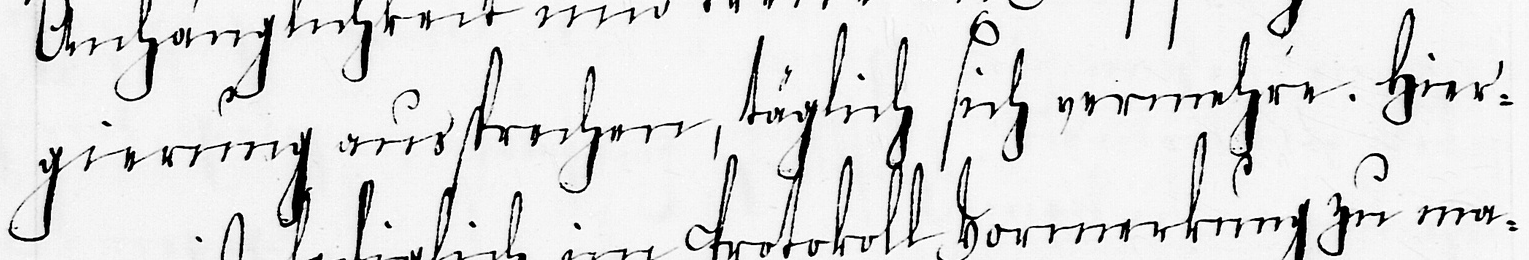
gierung aussprechen, täglich sich vermehre. Hier¬
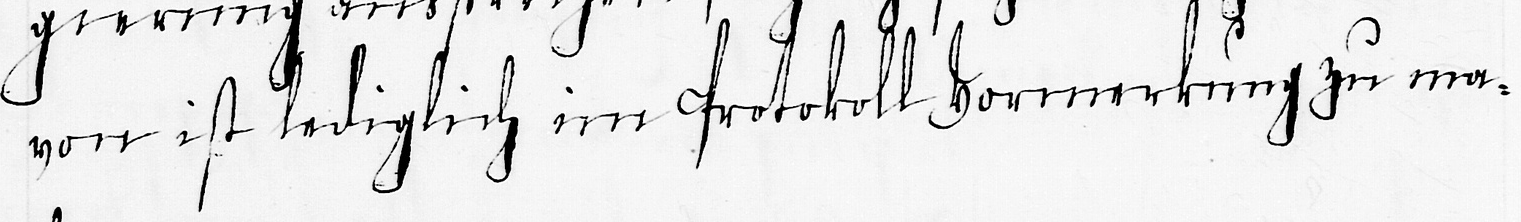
von ist lediglich im Protokoll Vormerkung zu ma¬
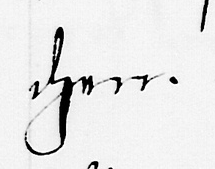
chen.
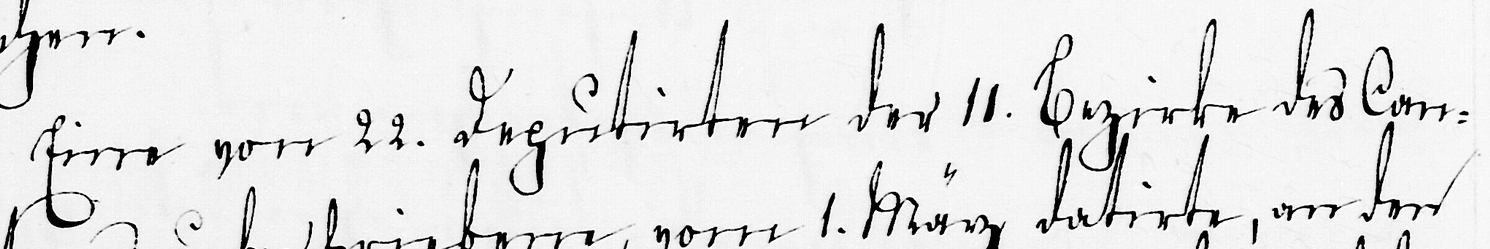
Eine von 22. Deputirten der 11. Bezirke des Can¬
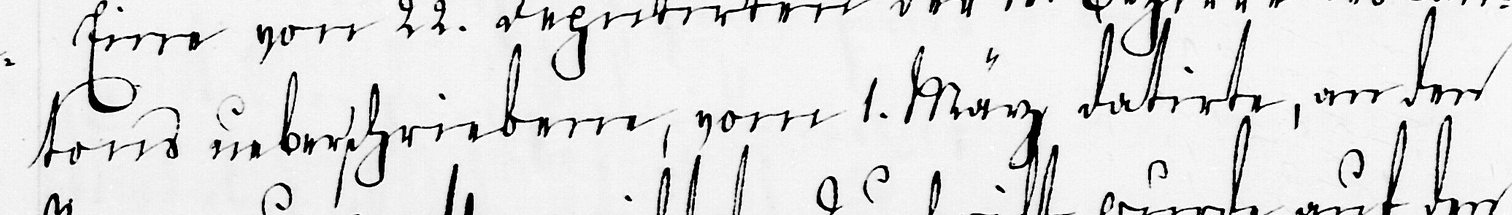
tons ueberschriebene, vom 1. März datirte, an den
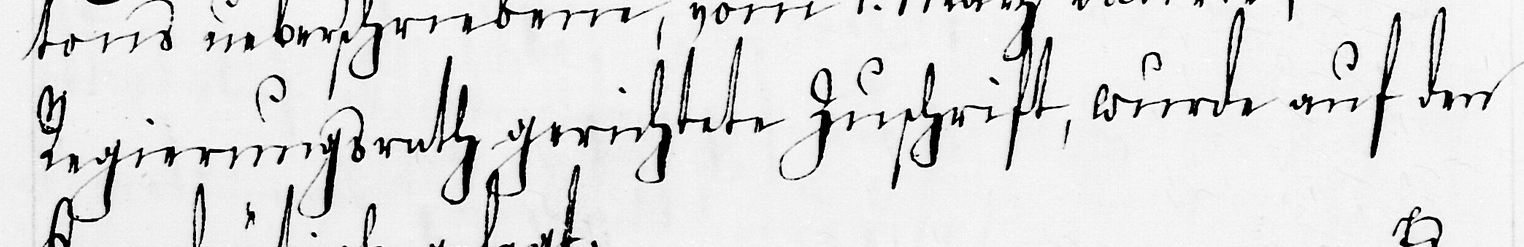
Regierungsrath gerichtete Zuschrift , wurde auf den
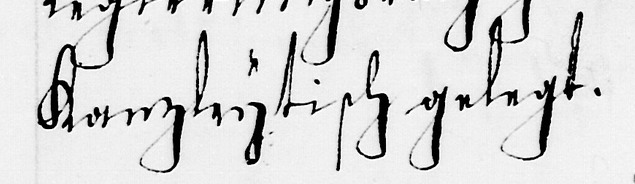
Kanzleytisch gelegt.
